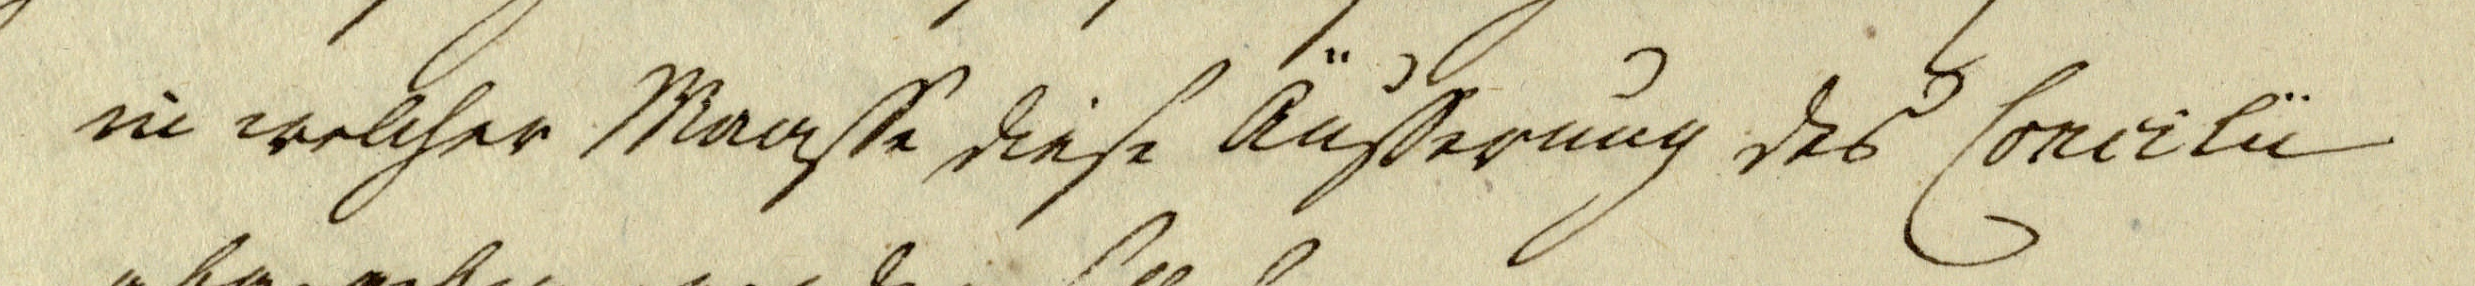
in welcher Maasse diese Äusserung des Concilii
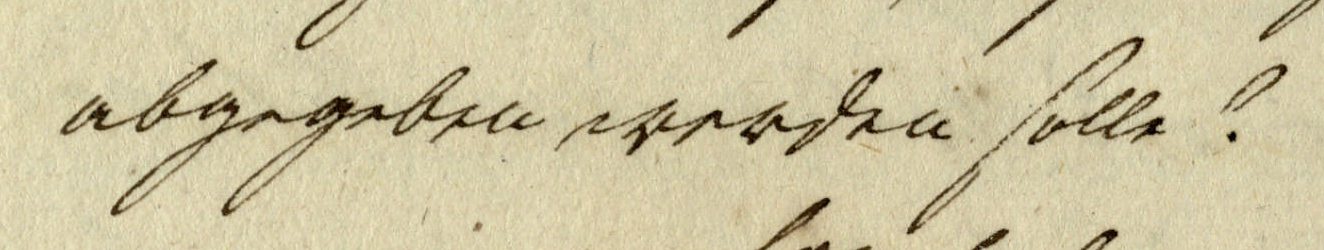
abgegeben werden solle ?
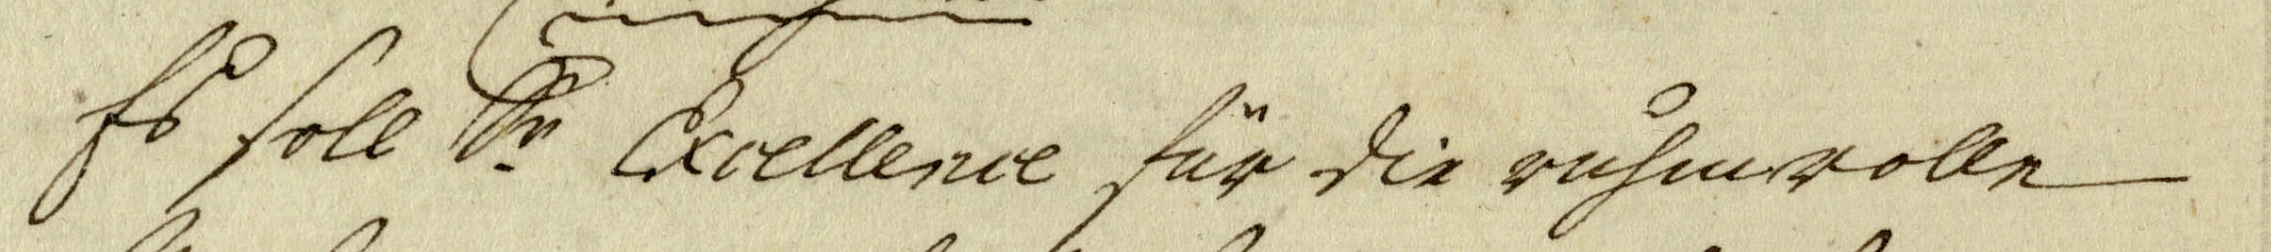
Es soll Sr Excellence für die ruhmvolle
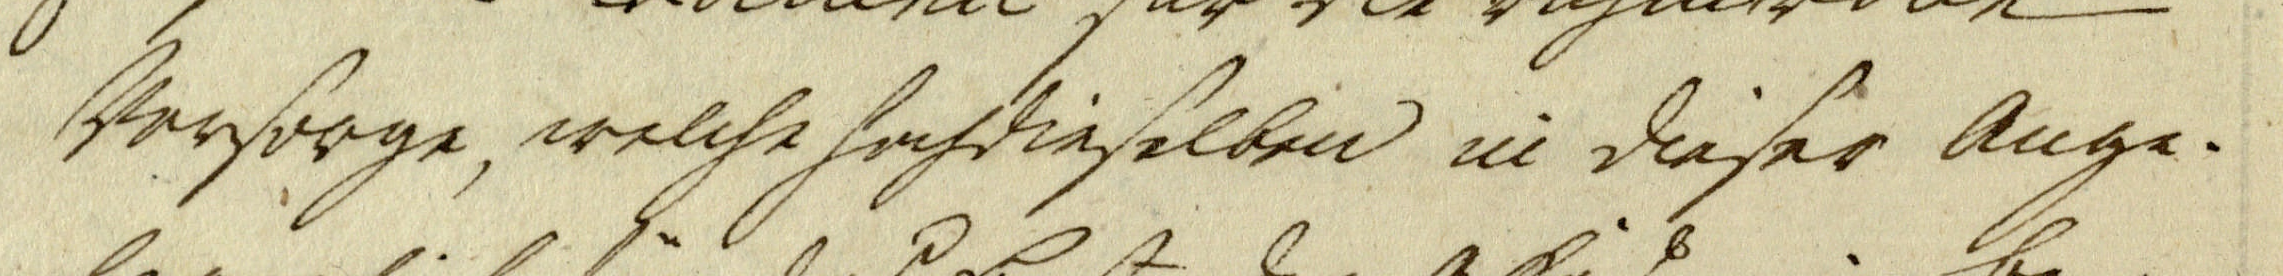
Vorsorge, welche hochdieselben in dieser Ange¬
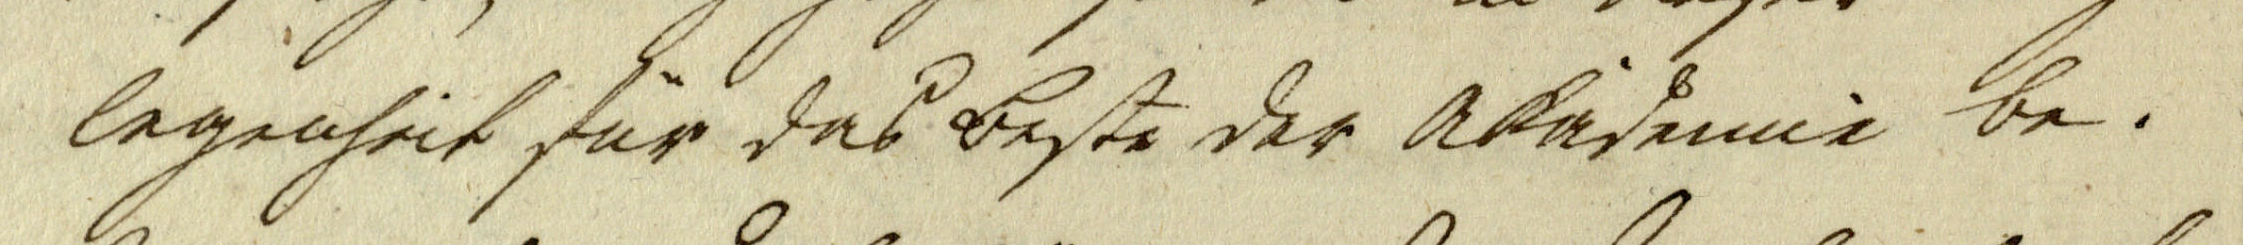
legenheit für das Beste der Akademie be¬
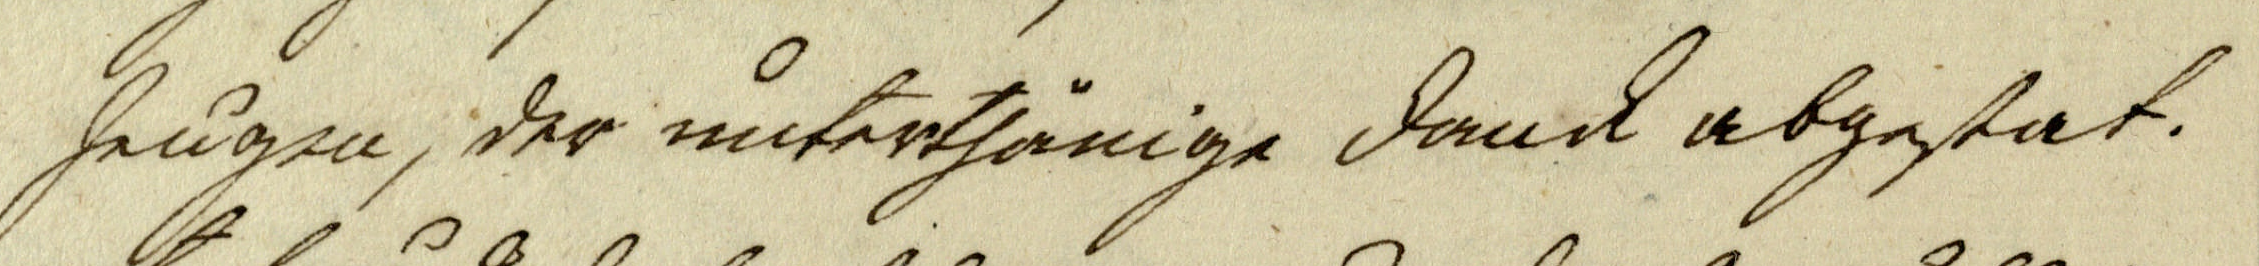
zeugen, der unterthänige Danck abgestat¬
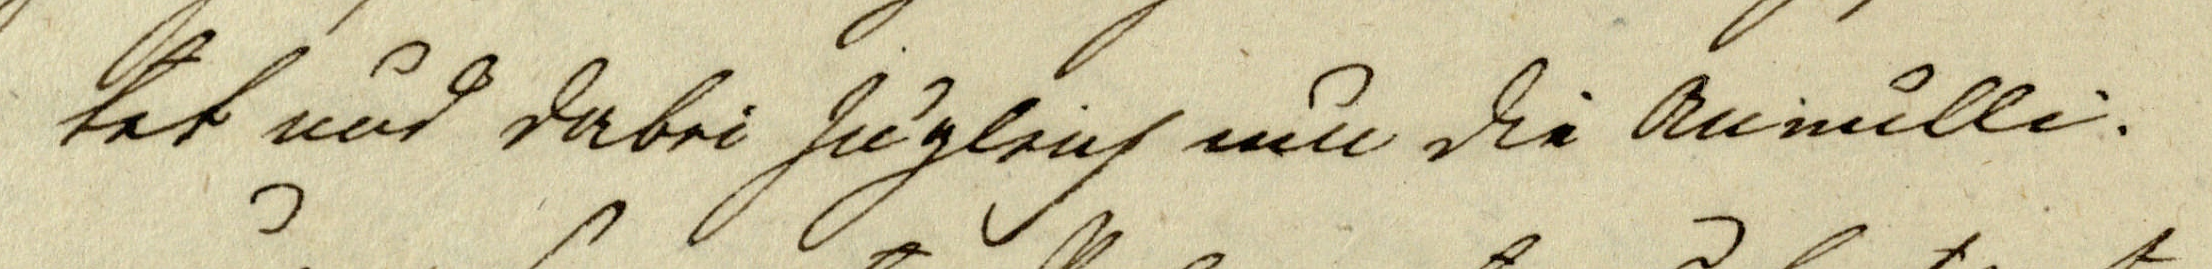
tet und dabei zugleich um die Annulli¬
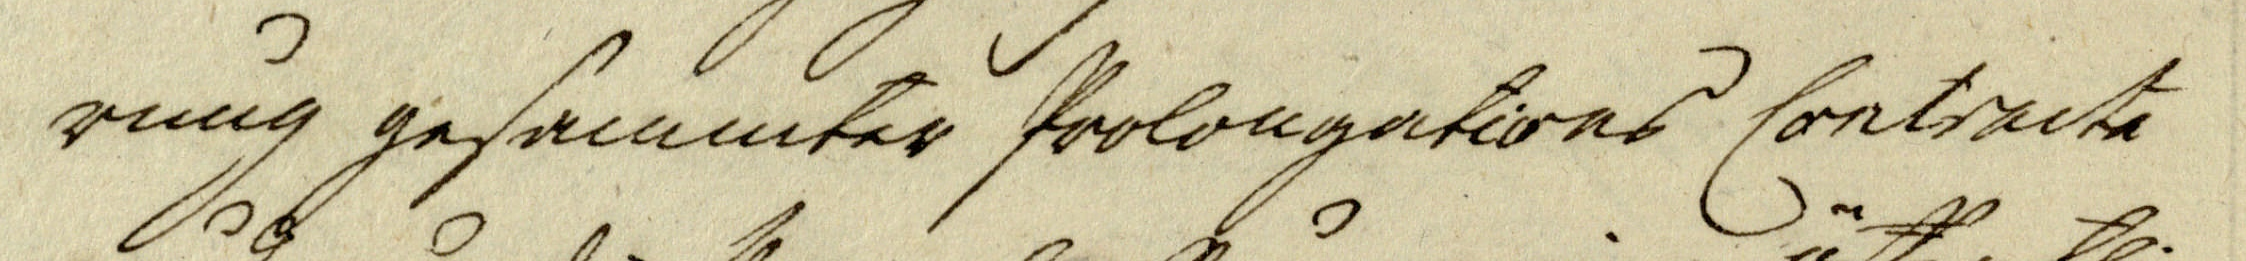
rung gesammter Prolongations Contracte
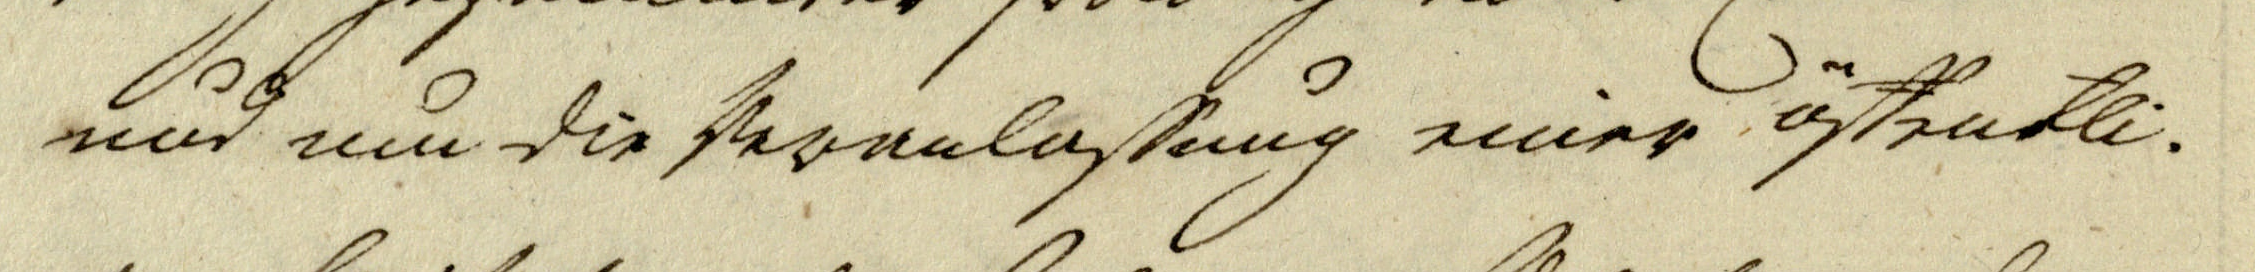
und um die Veranlassung einer öffentli¬
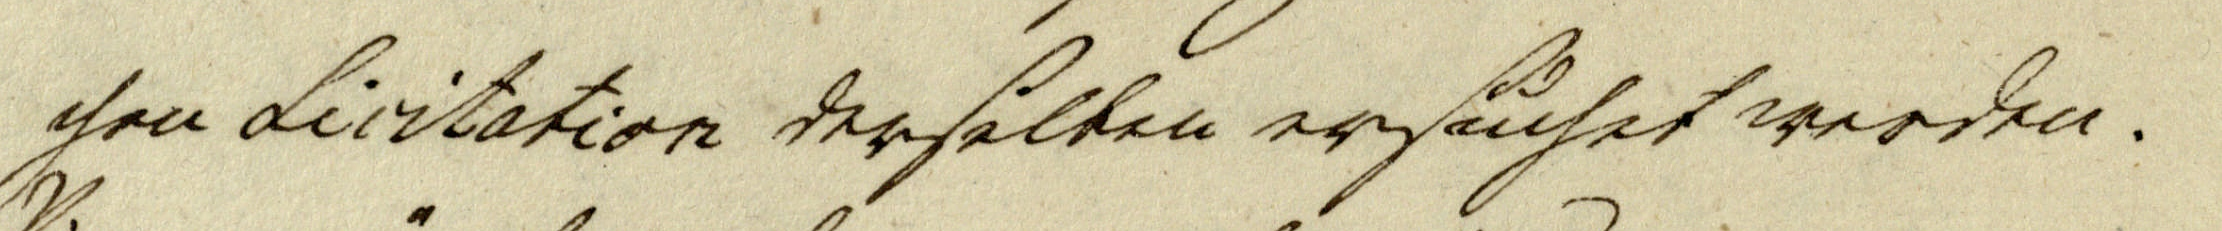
chen Licitation derselben ersuchet werden.
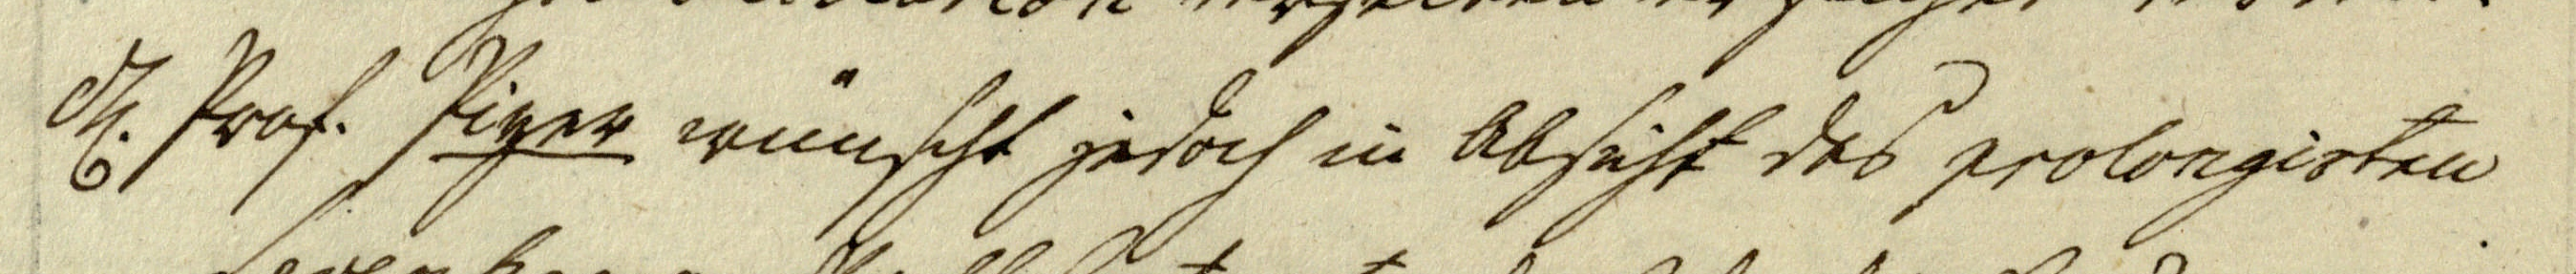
dh. Prof. Piper wünscht jedoch in Absicht des prolongirten
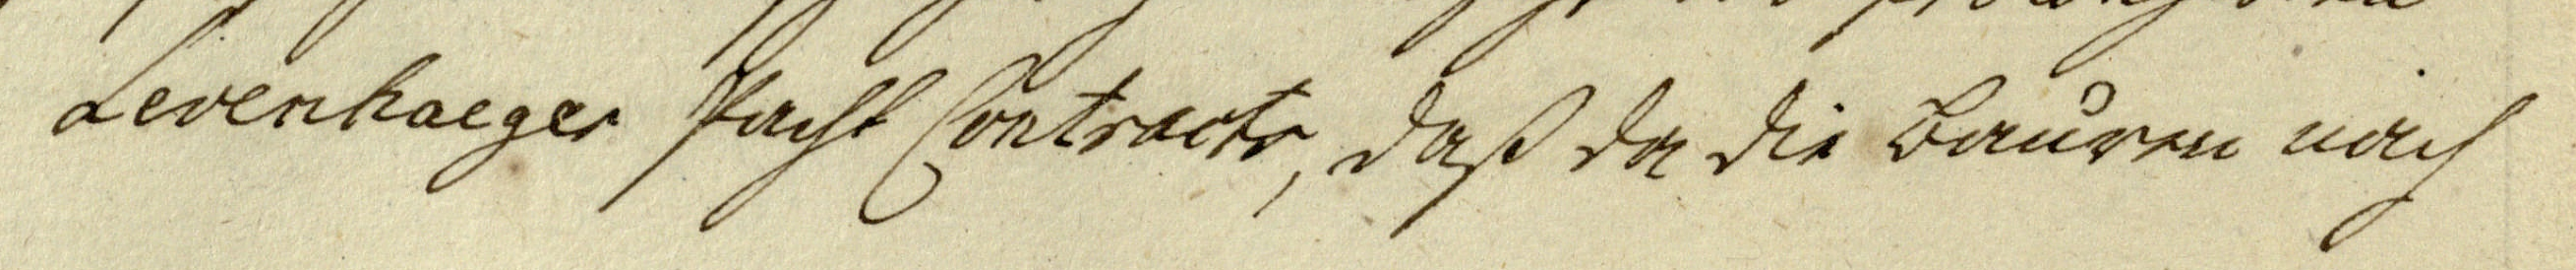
Levenhaeger Pacht Contracts, daß da die Bauren nach
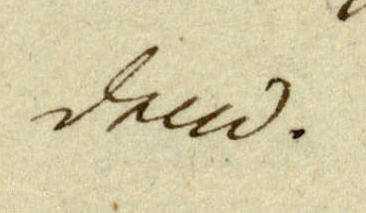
dem.
